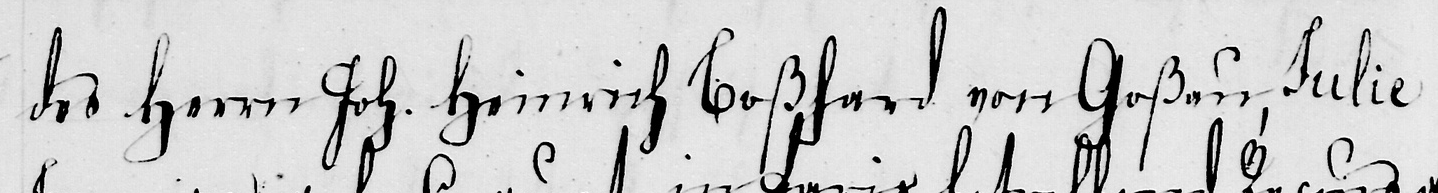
des Herrn Joh. Heinrich Boßhard von Goßau, Julie
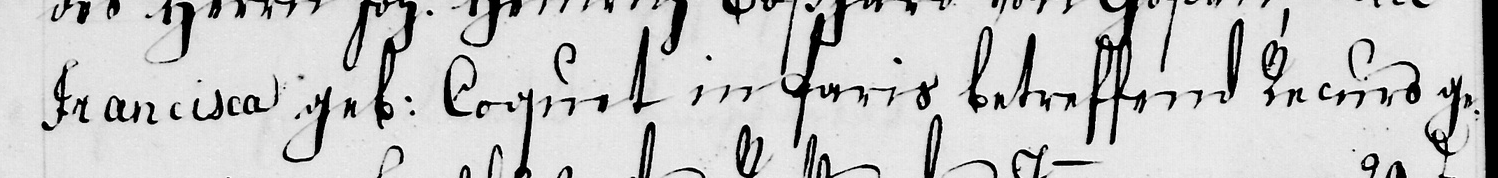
Francisca geb: Coquet in Paris betreffend Recurs ge¬
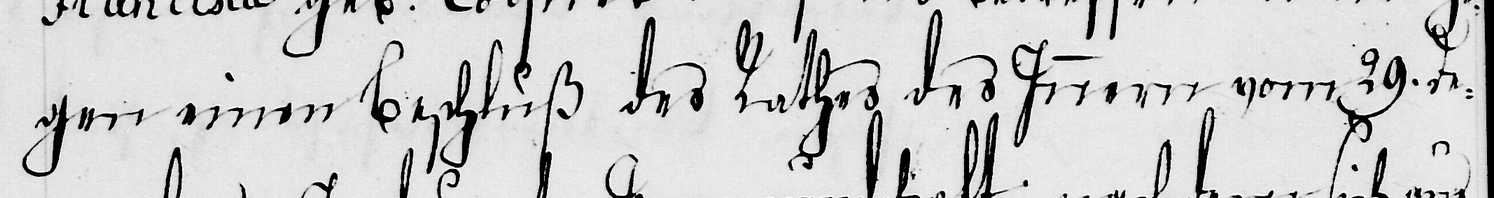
gen einen Beschluß des Rathes des Innern vom 29. De¬
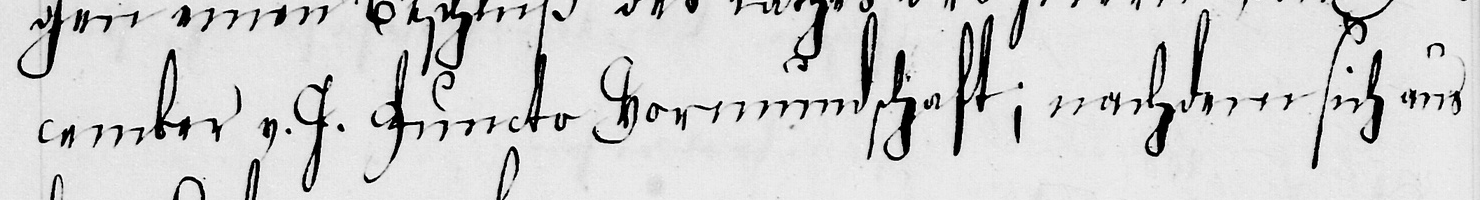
cember v. J. puncto Vormundschaft; nachdem sich aus
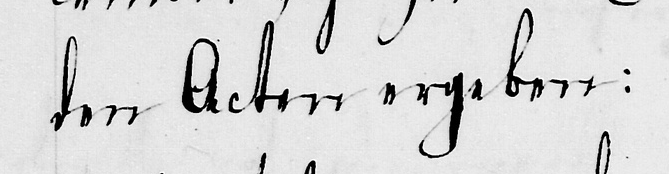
den Acten ergeben:
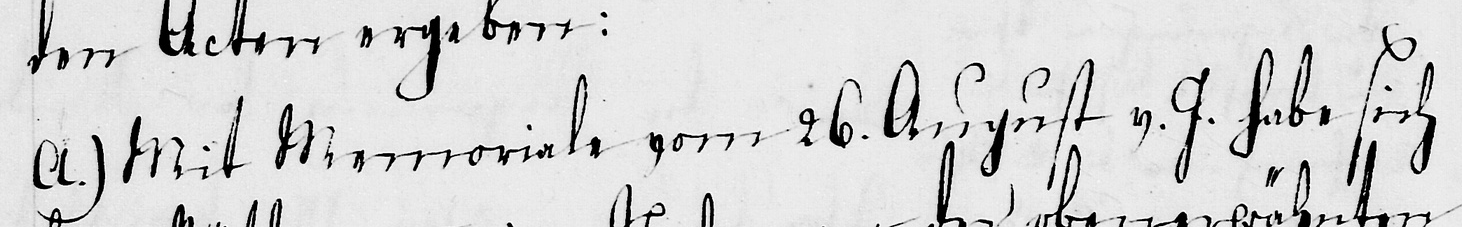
A.) Mit Memoriale vom 26. August v. J. habe sich
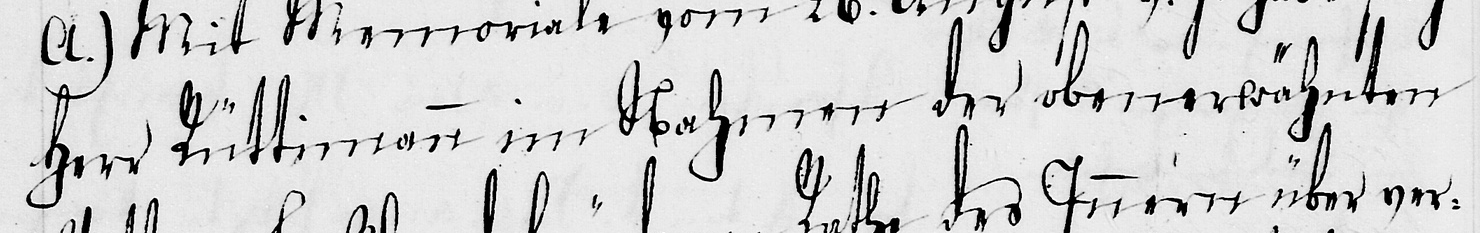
Herr Rüttimann im Nahmen der obenerwähnten
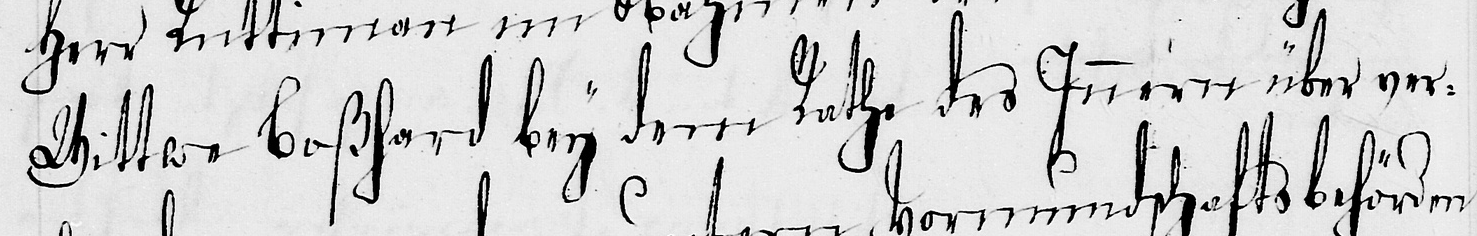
Wittwe Boßhard bey dem Rathe des Innern über ver¬
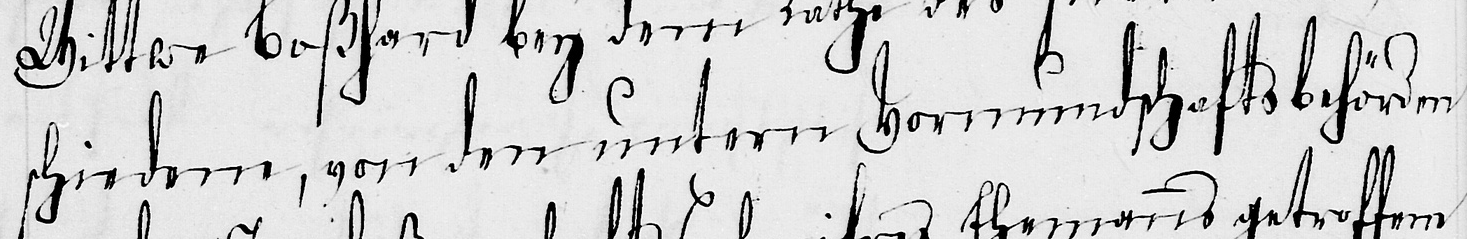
schiedene, von den untern Vormundschaftsbehörden
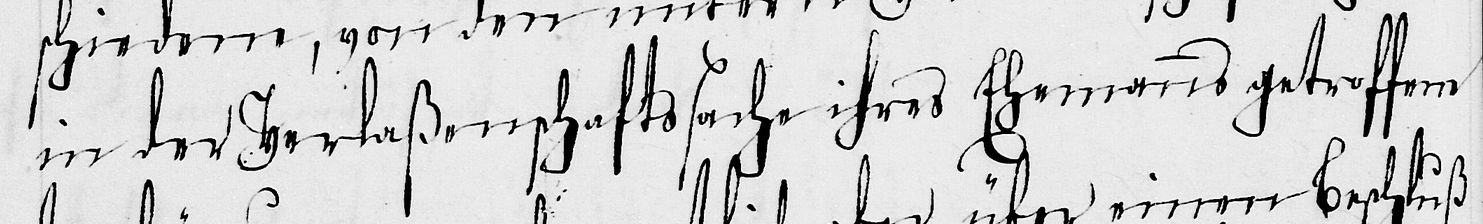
in der Verlaßenschaftssache ihres Ehemanns getroffene
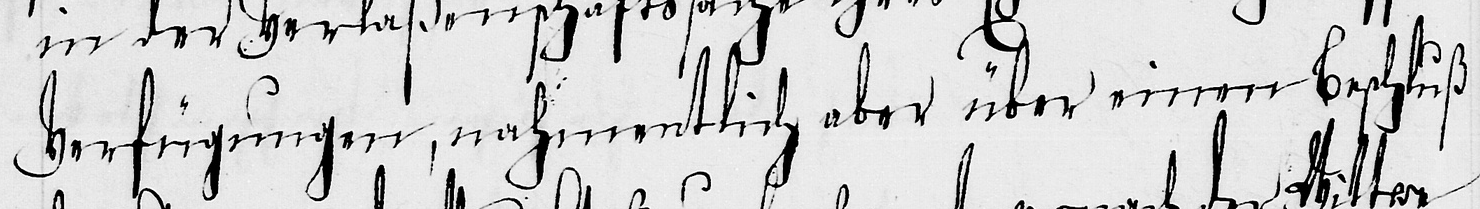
Verfügungen, nahmentlich aber über einen Beschluß
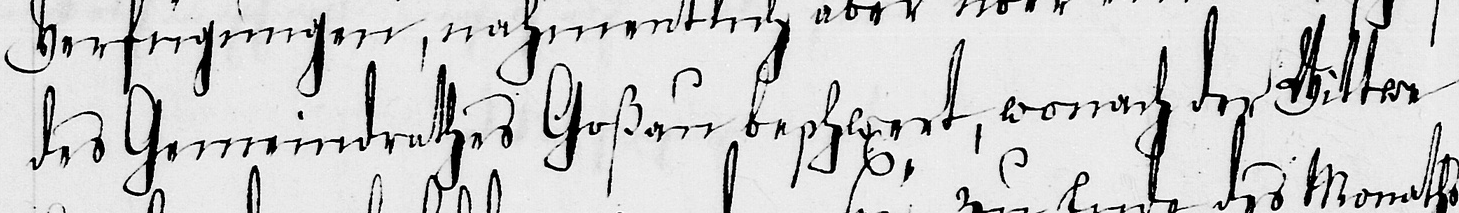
des Gemeindrathes Goßau beschwert, wonach der Wittwe
